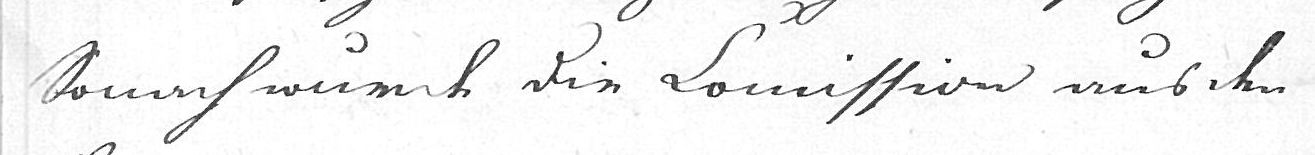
Sonach wurde die Commission aus den
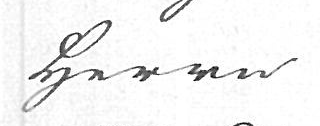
Herrn
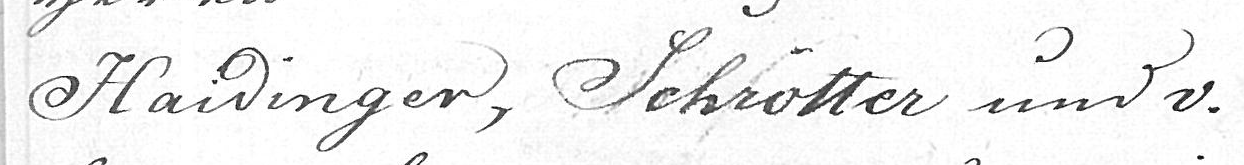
Haidinger, Schrötter und v.
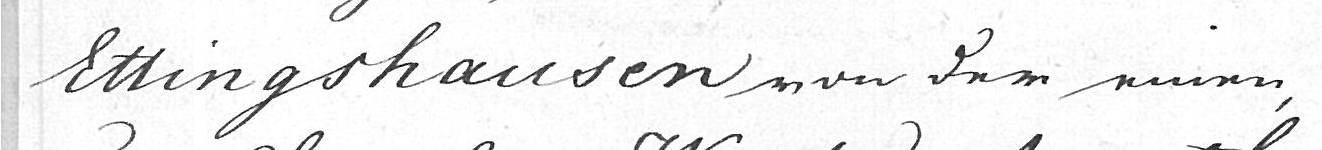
Ettingshausen von der einen
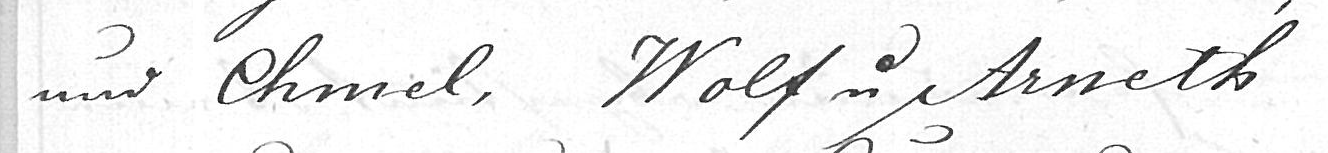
und Chmel, Wolf u. Arneth
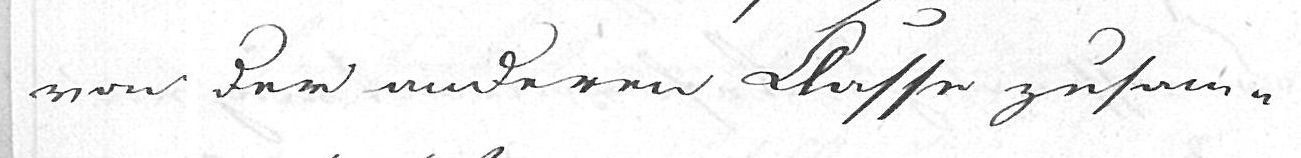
von der anderen Classe zusam-
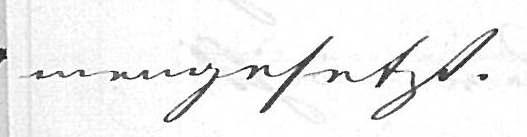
mengesetzt.
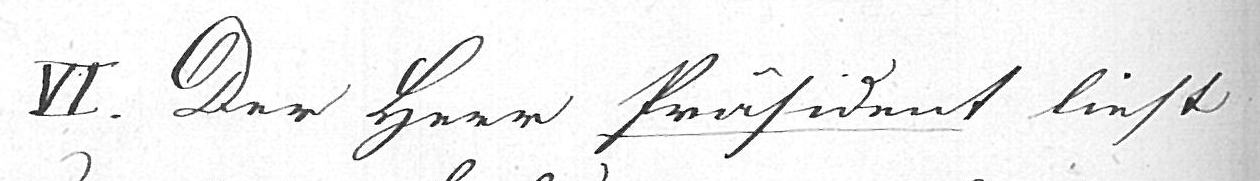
VI. Der Herr Präsident liest
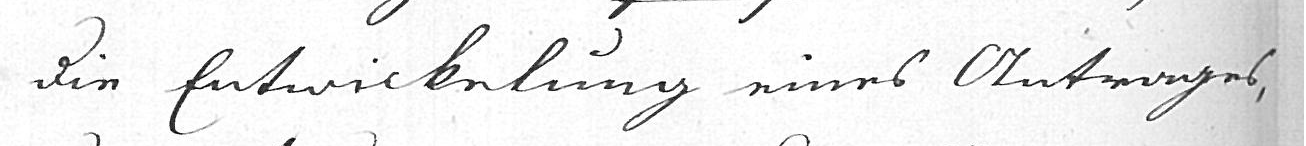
die Entwickelung eines Antrages,
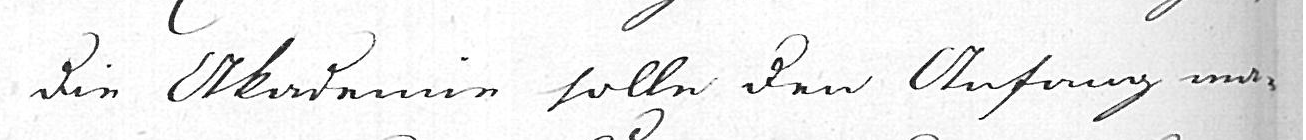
die Akademie solle den Anfang ma-
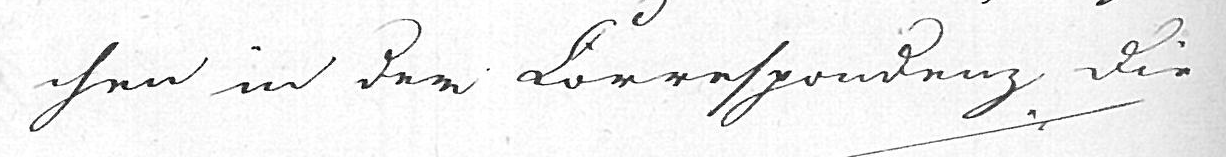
chen in der Correspondenz die
